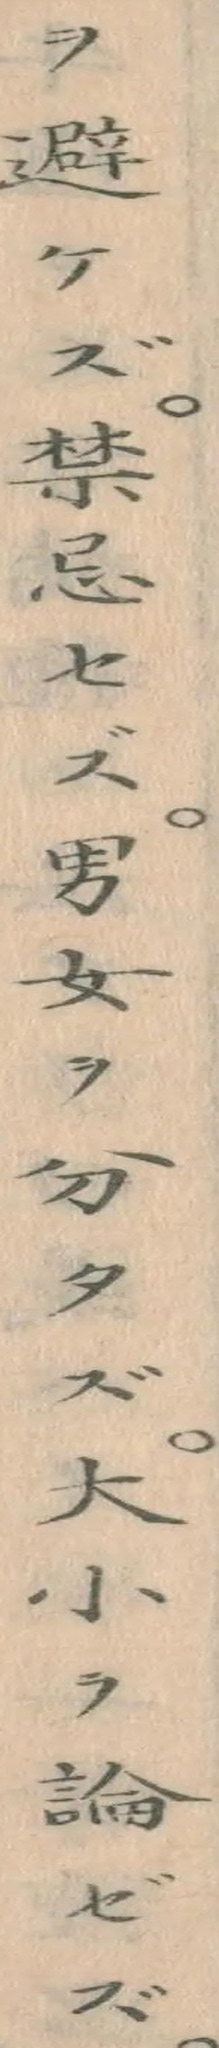ヲ避ケズ。禁忌セズ。男女ヲ分タズ。大小ヲ論ゼズ。
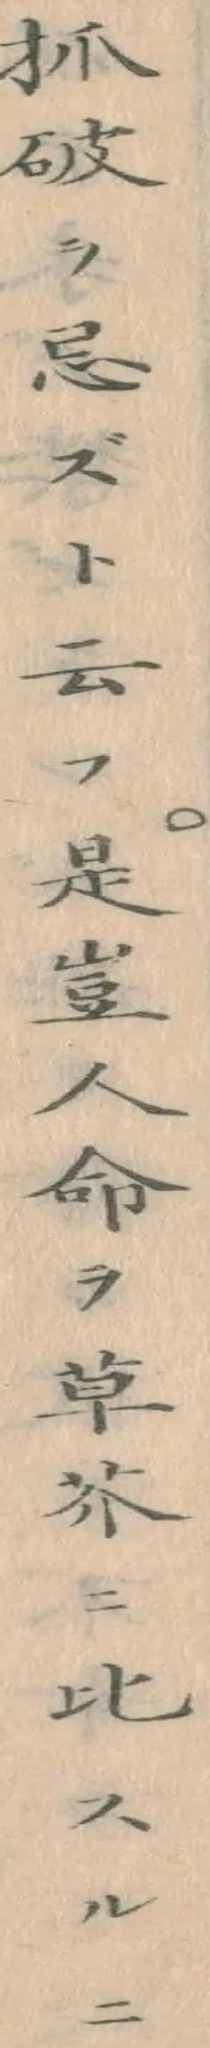抓破ヲ忌ズト云フ。是豈人命ヲ草芥ニ比スルニ
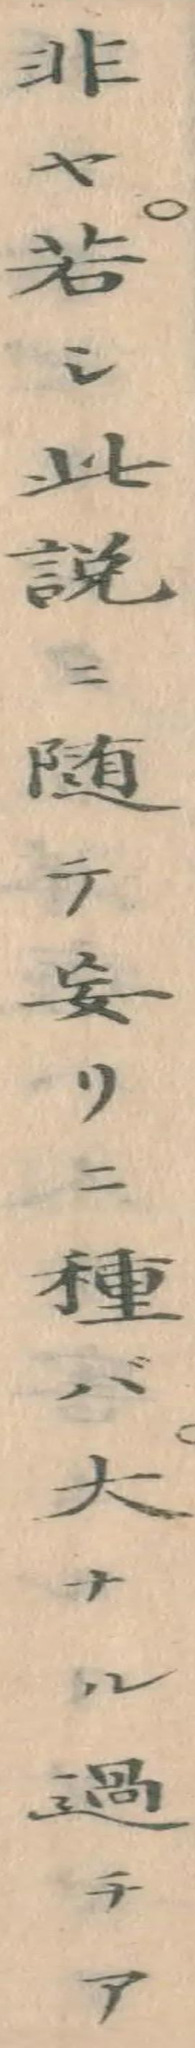非ヤ。若シ此説ニ随テ妄リニ種バ。大ナル過チア
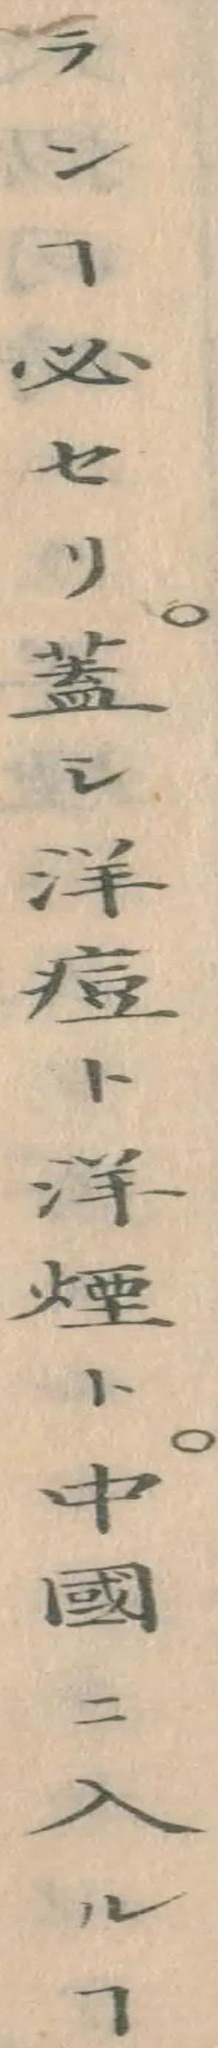ランヿ必セリ。蓋シ洋痘ト洋煙ト。中国ニ入ルヿ

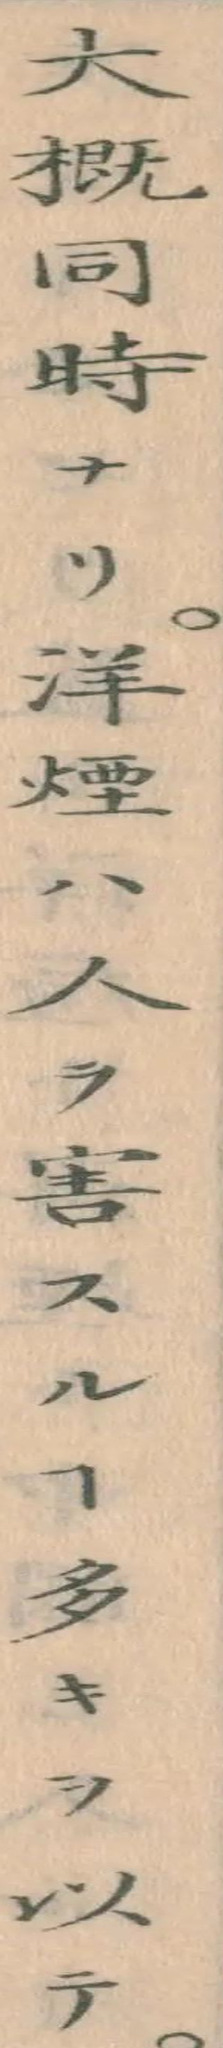大概同時ナリ。洋煙ハ人ヲ害スルヿ多キヲ以テ。
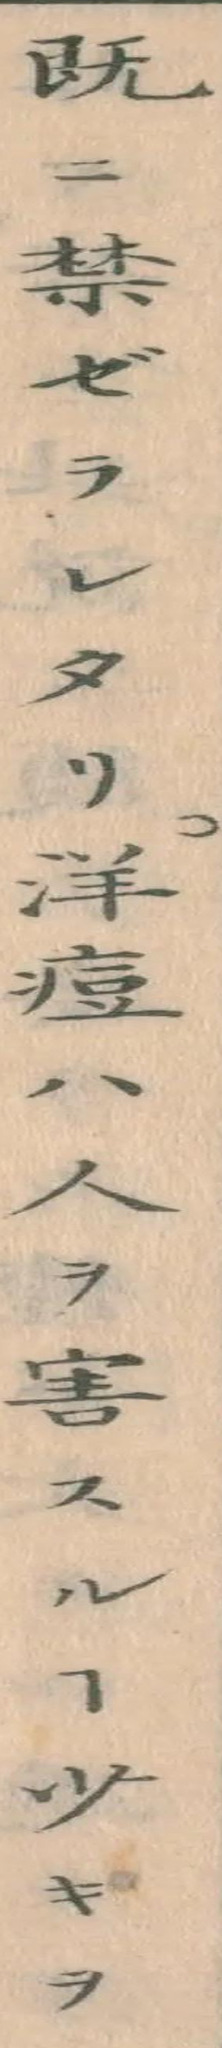既ニ禁ゼラレタリ。洋痘ハ人ヲ害スルヿ少キヲ
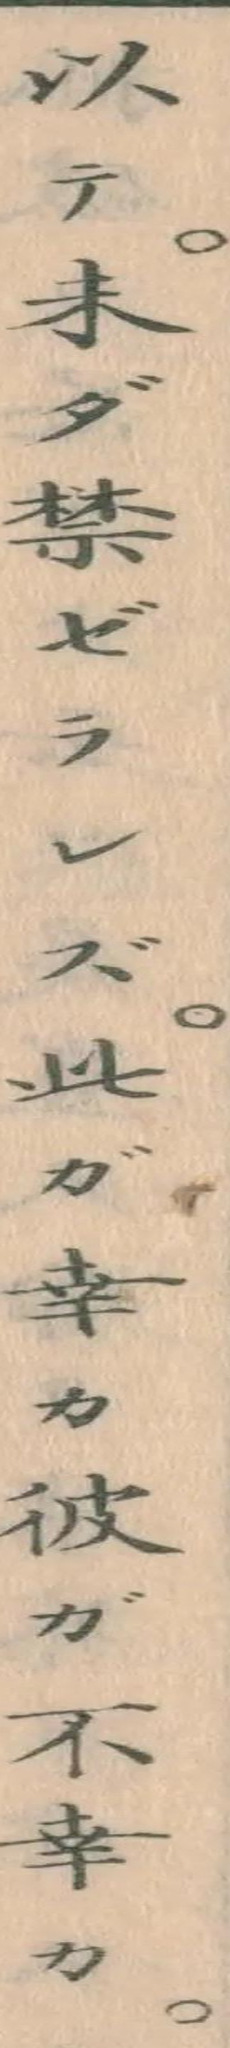以テ。未ダ禁ゼラレズ。此ガ幸カ彼ガ不幸カ。
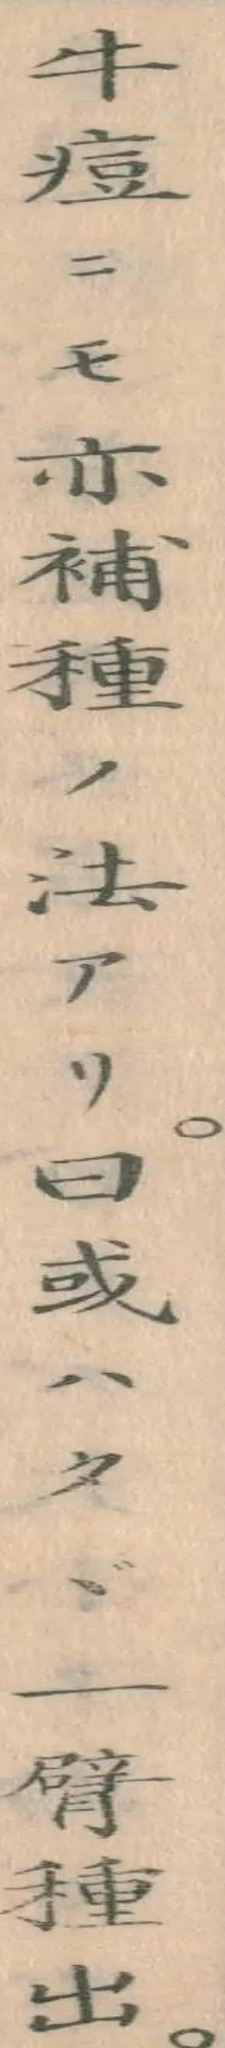牛痘ニモ亦補種ノ法アリ。曰或ハタヾ一臂種出。
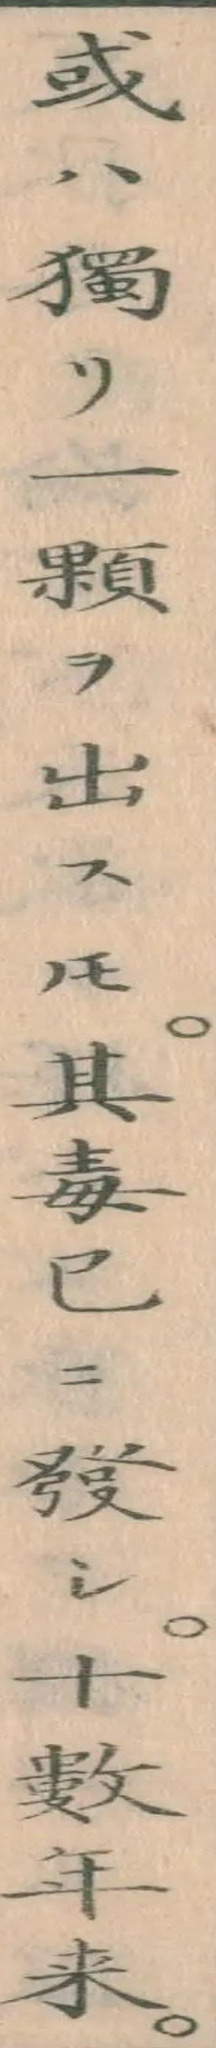或ハ独リ一顆ヲ出ス𪜈。其毒已ニ発シ。十数年来。
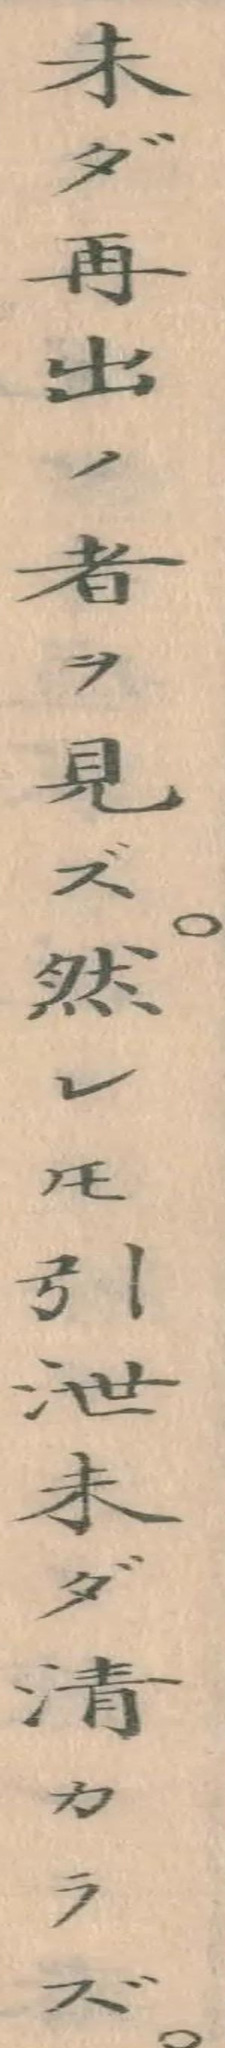未ダ再出ノ者ヲ見ズ。然レ𪜈引泄未ダ清カラズ。
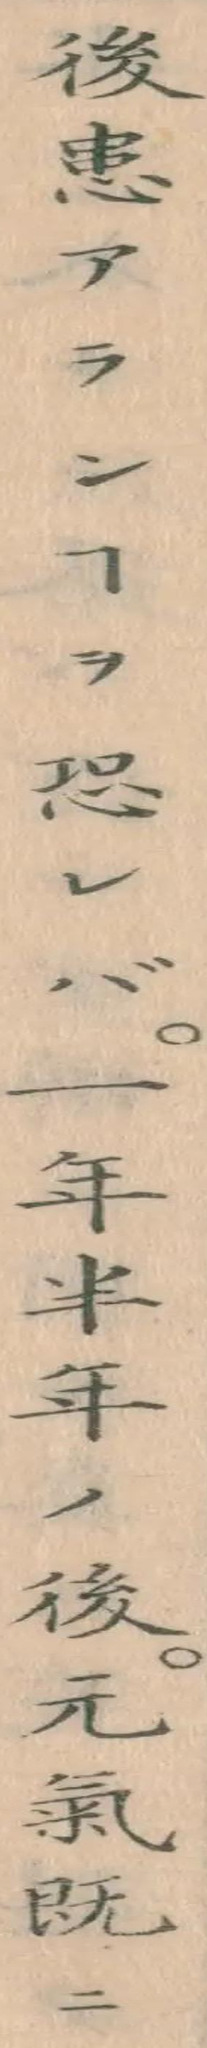後患アランヿヲ恐レバ。一年半年ノ後。元気既ニ
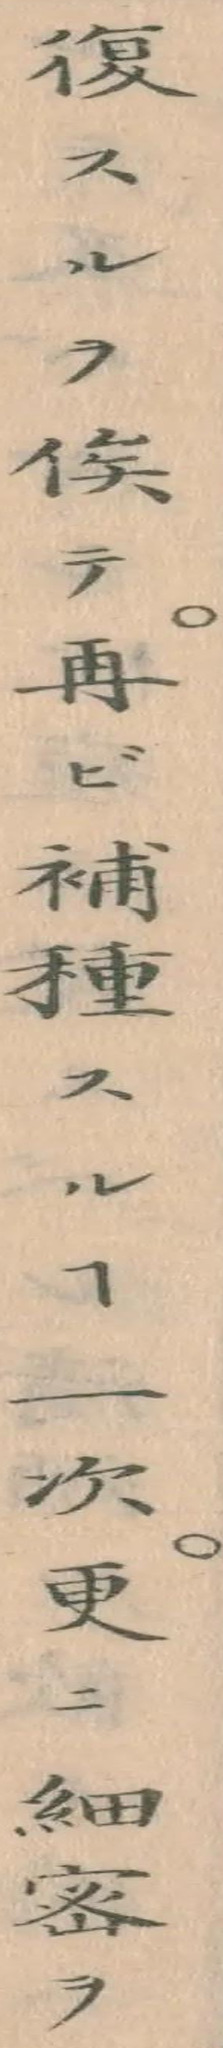復スルヲ俟テ。再ビ補種スルヿ一次。更ニ細密ヲ
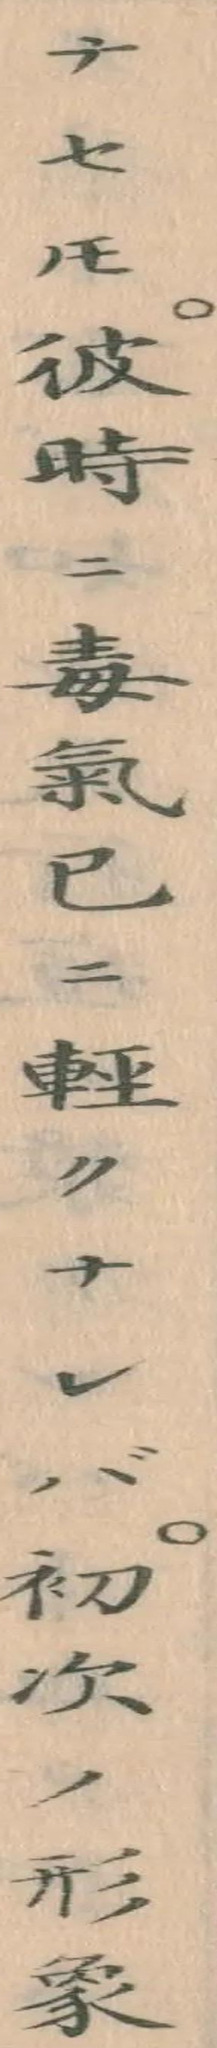ナセ𪜈。彼時ニ毒気已ニ軽クナレバ。初次ノ形象
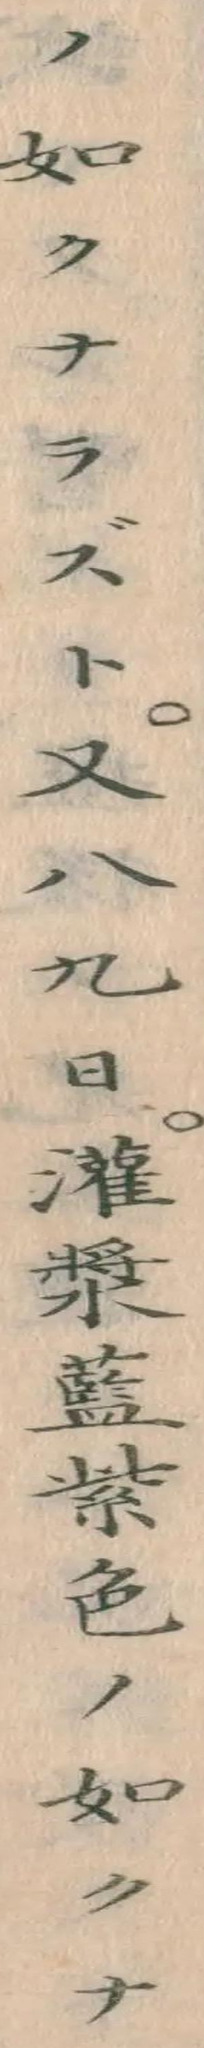ノ如クナラズト。又八九日。灌漿藍紫色ノ如クナ
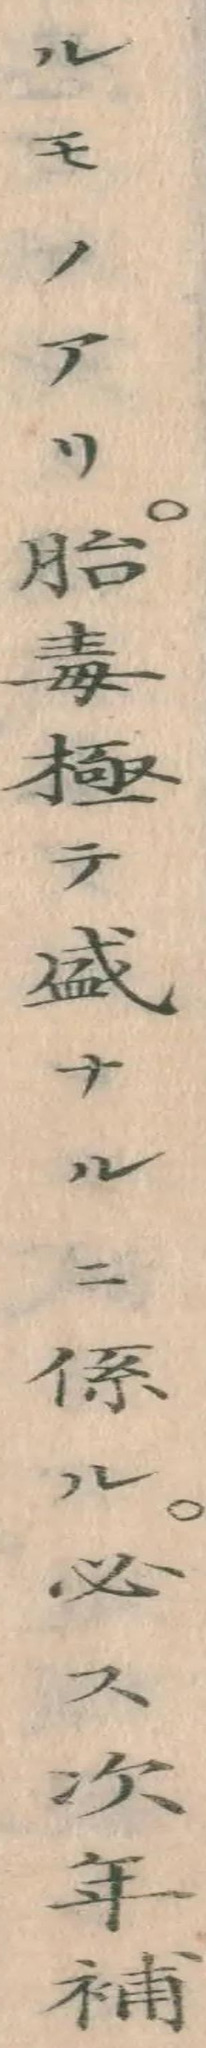ルモノアリ。胎毒極テ盛ナルニ係ル。必ス次年補
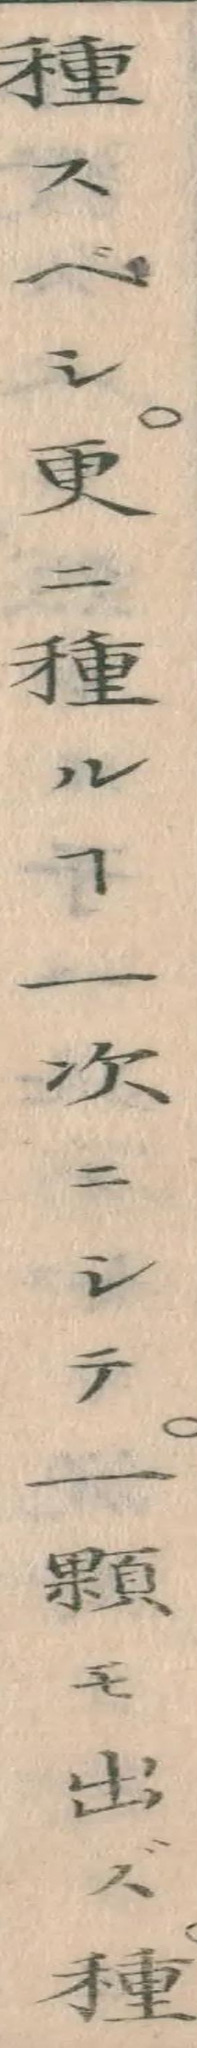種スベシ。更ニ種ルヿ一次ニシテ。一顆モ出ズ。種
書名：種痘弁義
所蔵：国立国会図書館 National Diet Library, JAPAN
